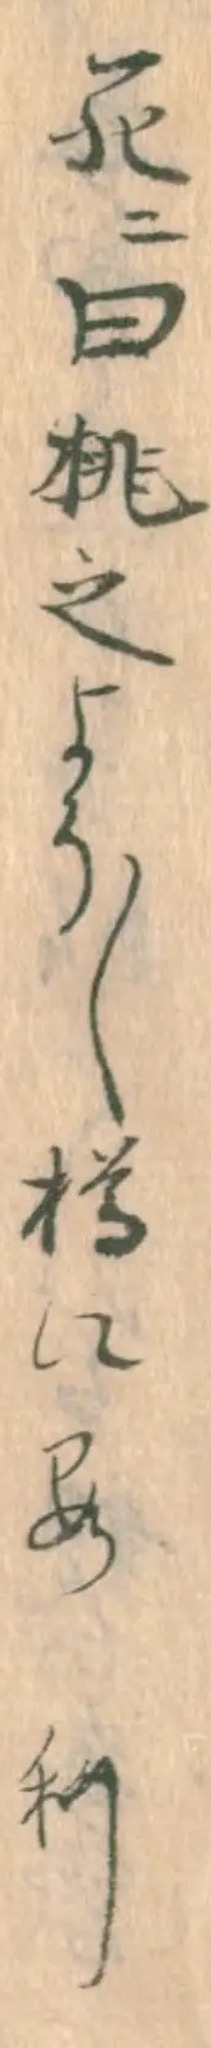死ニ曰桃のようよう樽にあり
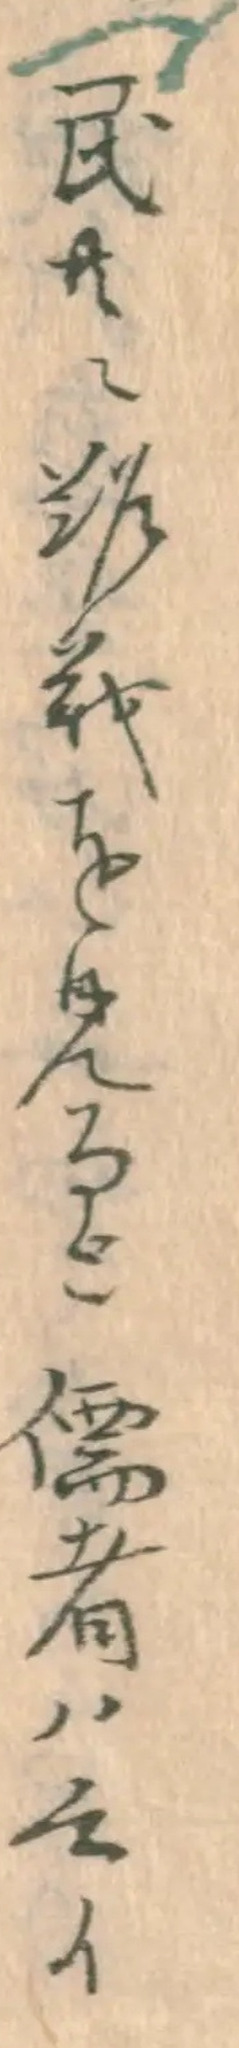民共々難儀を見ると儒者は云イ
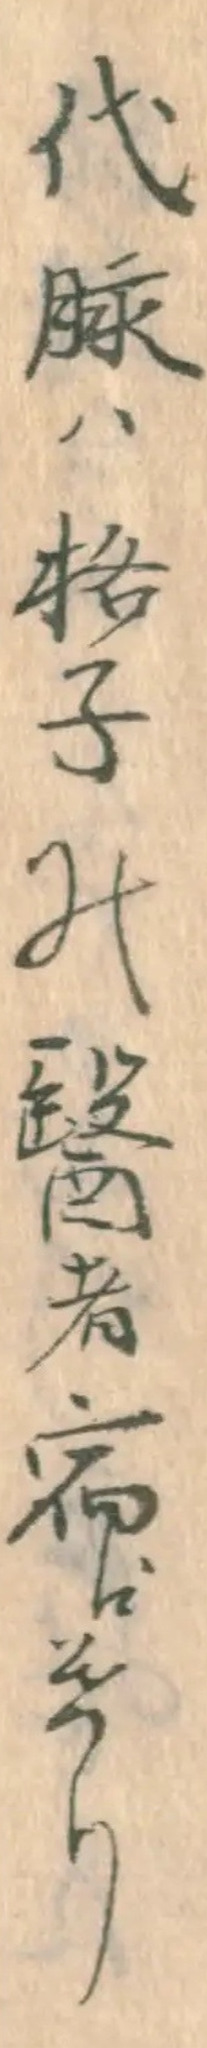代脈は格子の医者宿え遣り
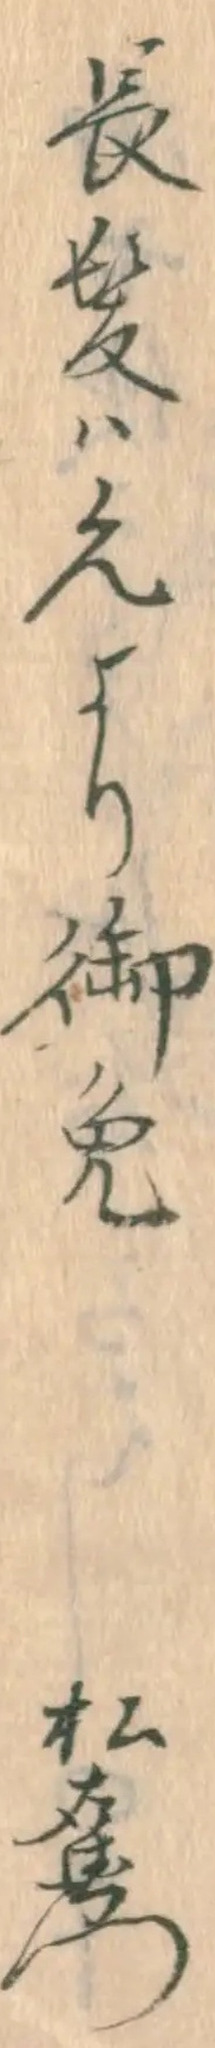長髪は元より御免松右衛門
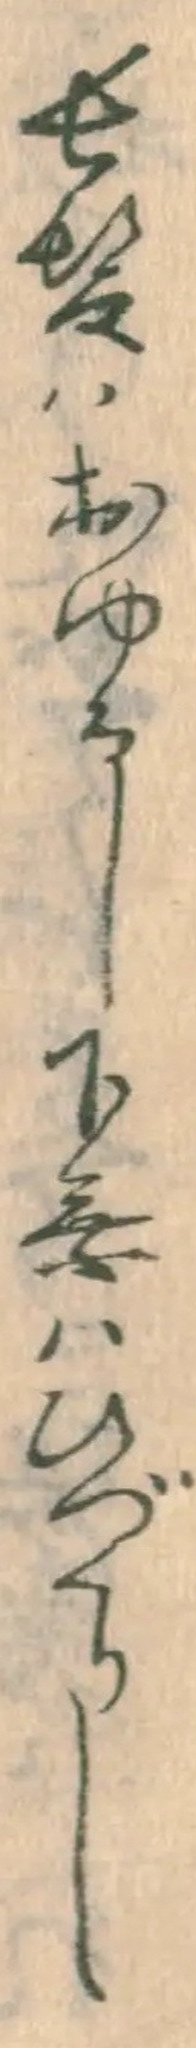長髪はおゆるし下乗はひつくりし
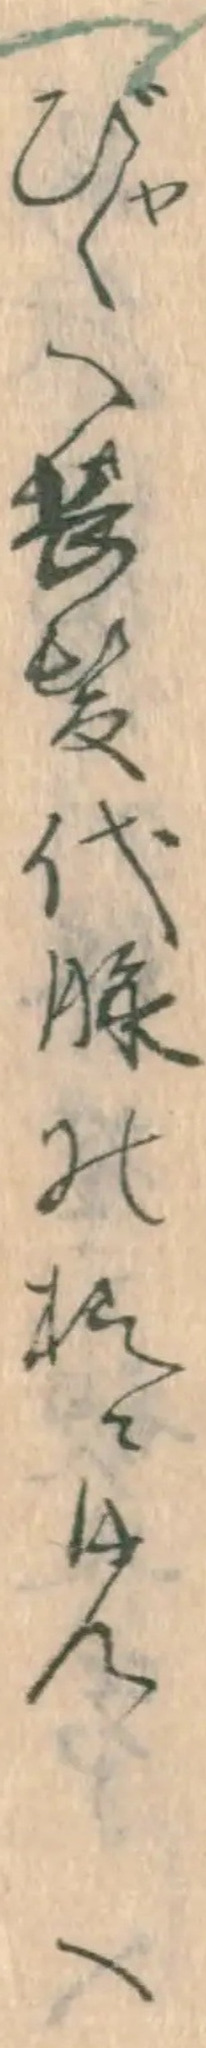びゃくへ長髪代脈の様にへ
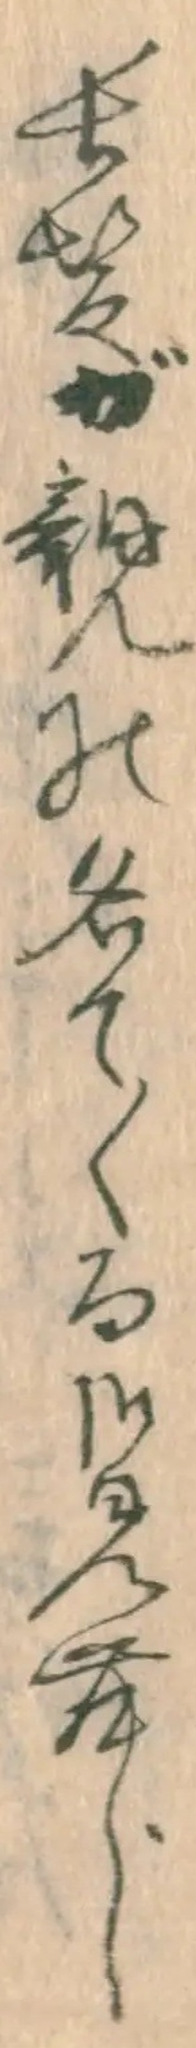長髪が親の名でくる御見舞
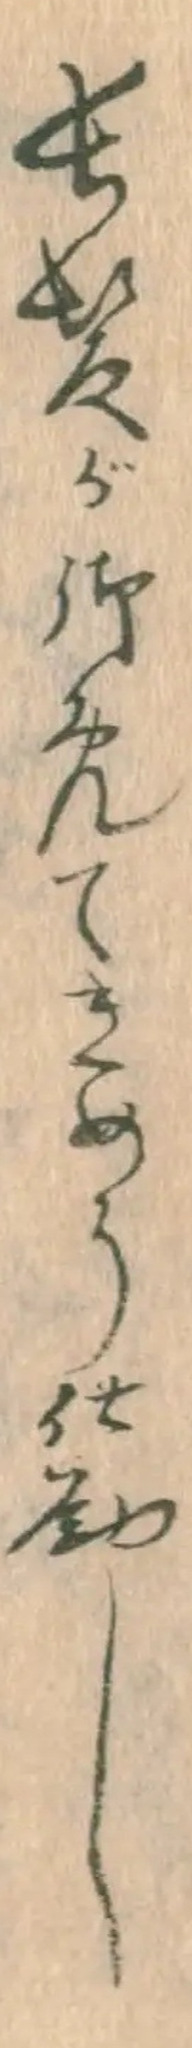長髪が御免てきめう仕勤し
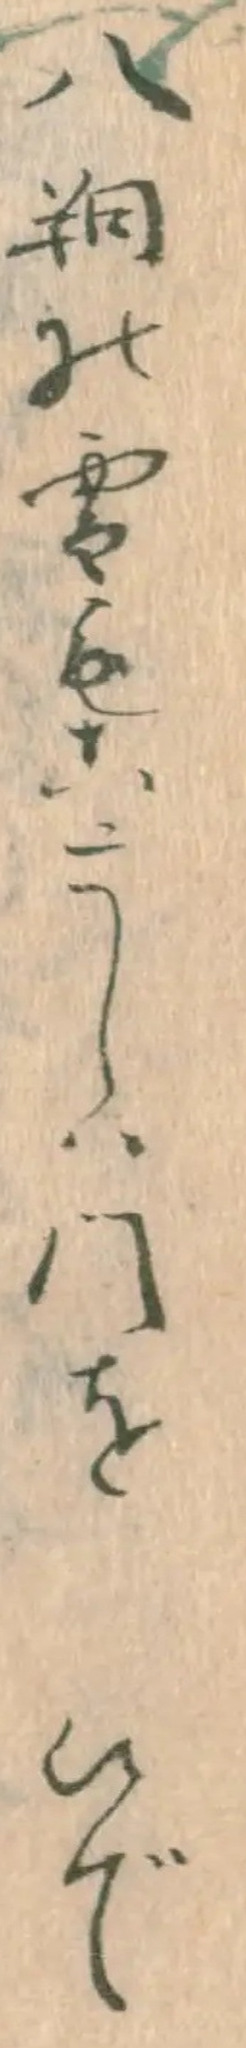八朔の雪もことしは門をいで
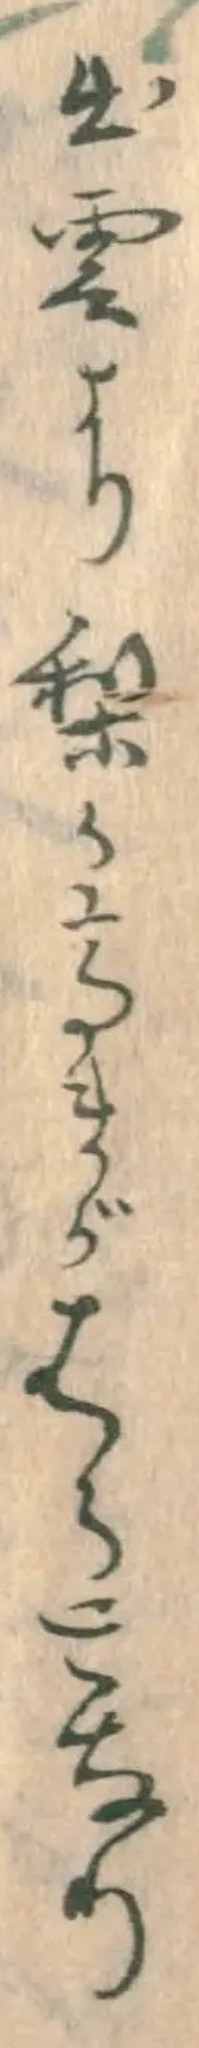出雲より梨が高まがはらとなり
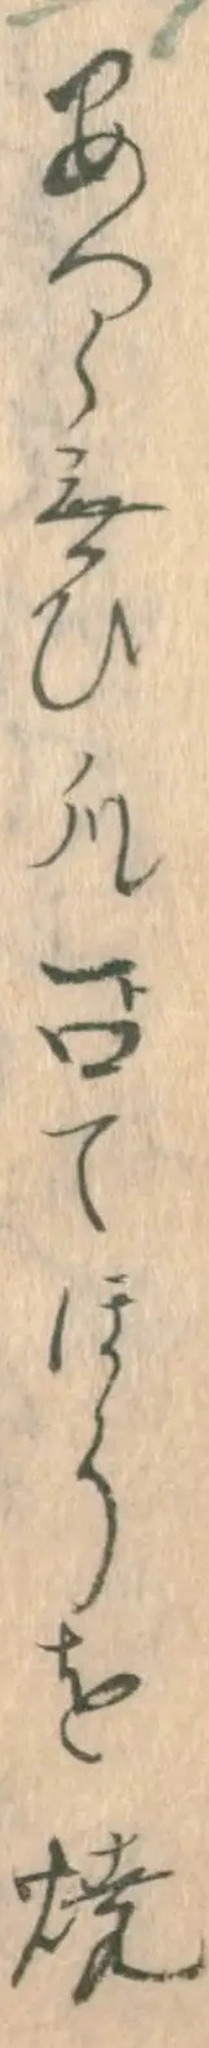あつく無ひ瓜一ㇳ口てほうを焼
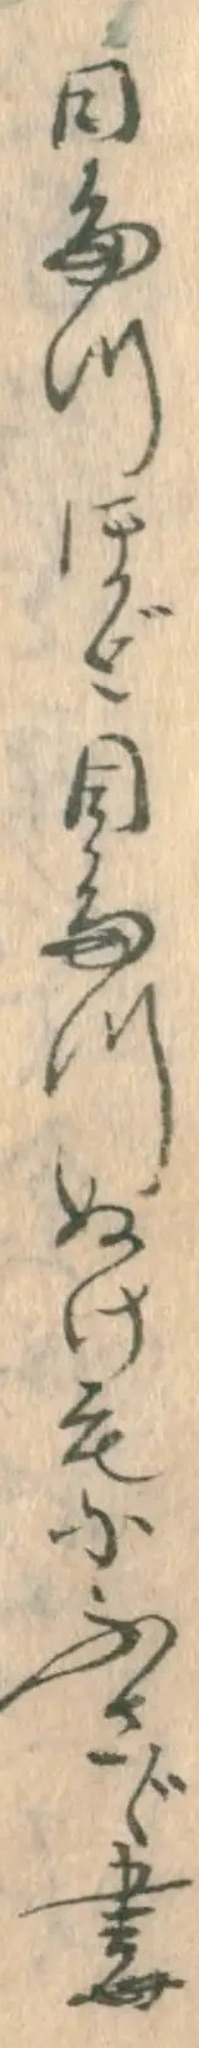目だつほど目だつぬけ毛にふさぐ妻
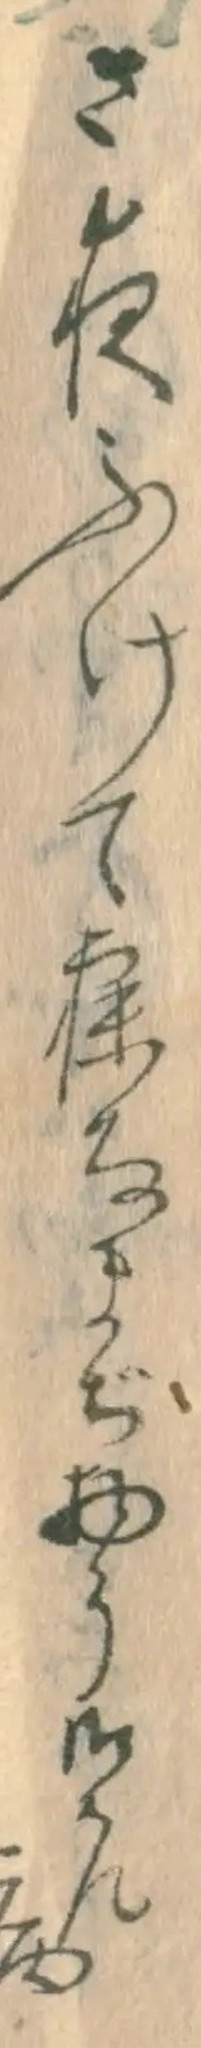さ夜ふけて寝なまぢ物う御かん病

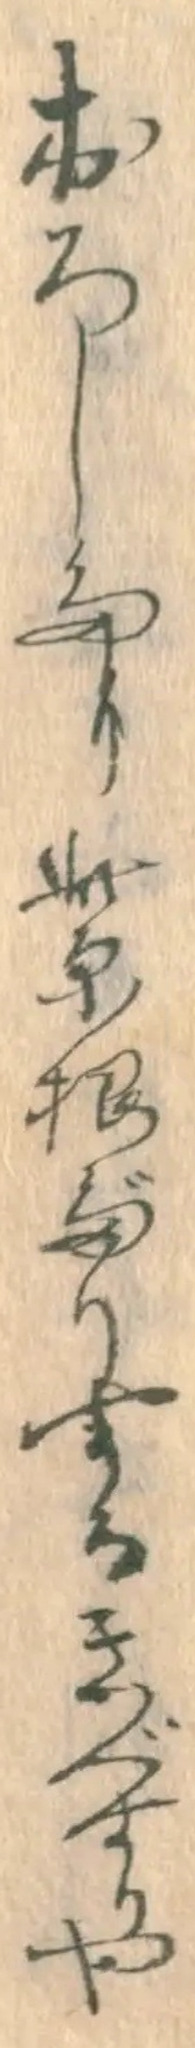おろしたり紫根だりするきぐすりや
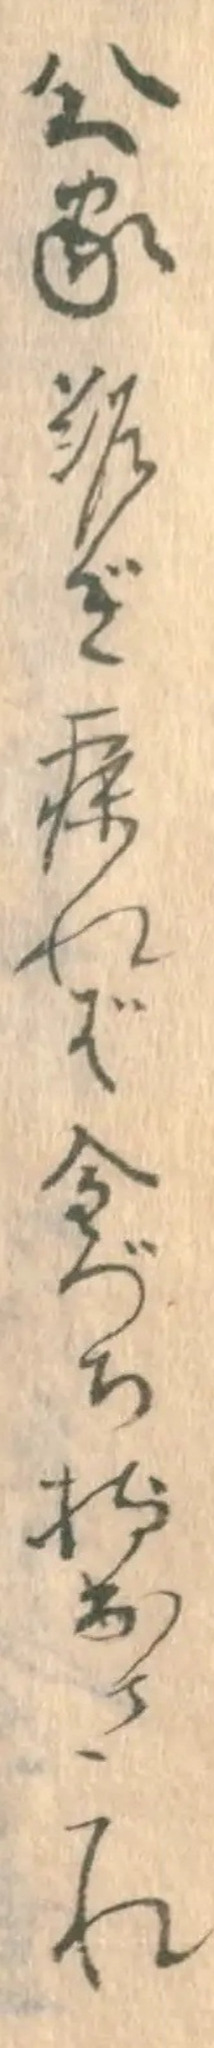公家難ぎ寝れば金づち持出され
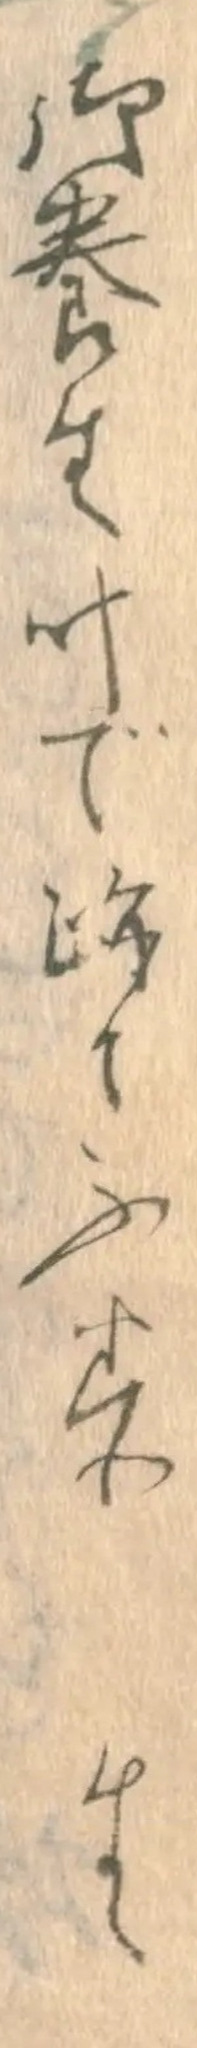御養生叶て跡で不養生
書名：麻疹後柳樽
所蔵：国立国会図書館 National Diet Library, JAPAN
